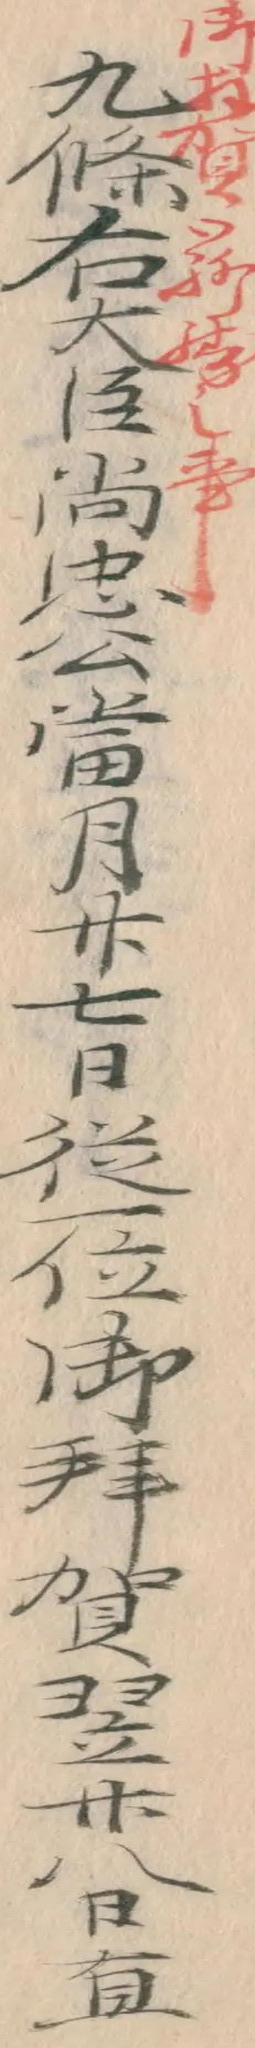一九條右大臣尚忠公當月廿七日従一位御拝賀翌廿八日直
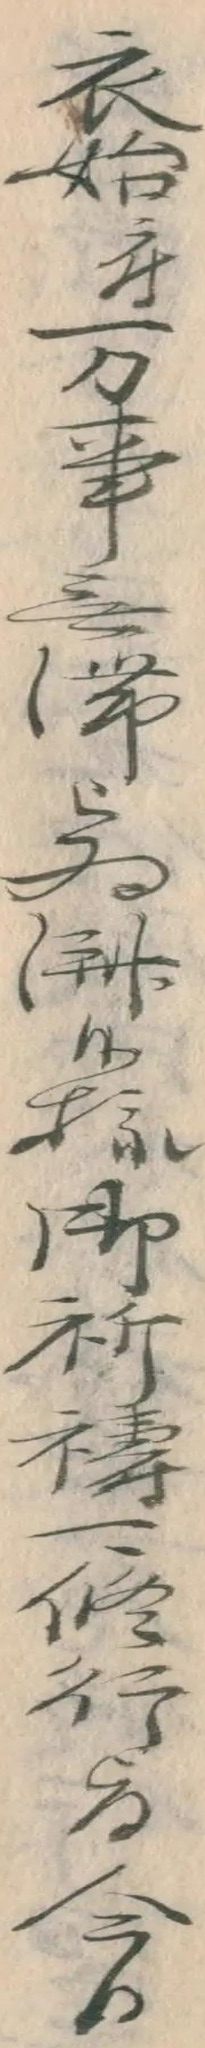衣始ニ付万事無滞被為済候様御祈祷可修行旨今日
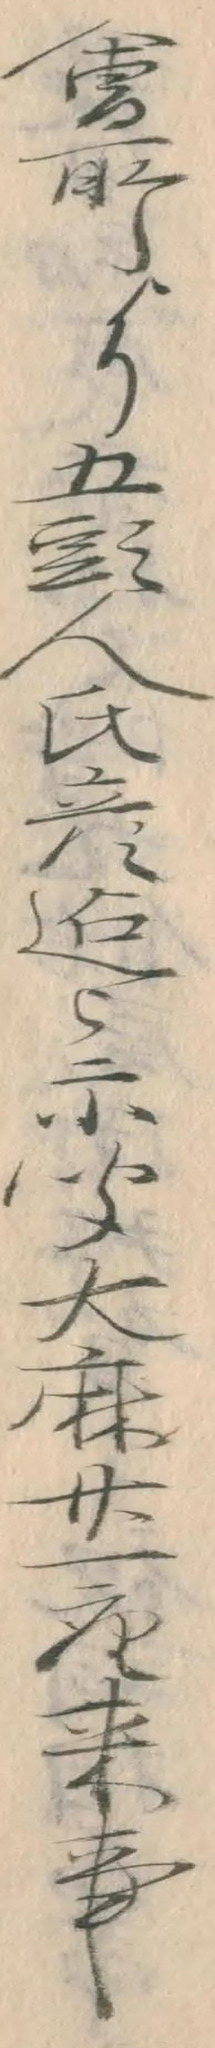會所より五頭人氏彦迄被示聞大麻廿一座来事
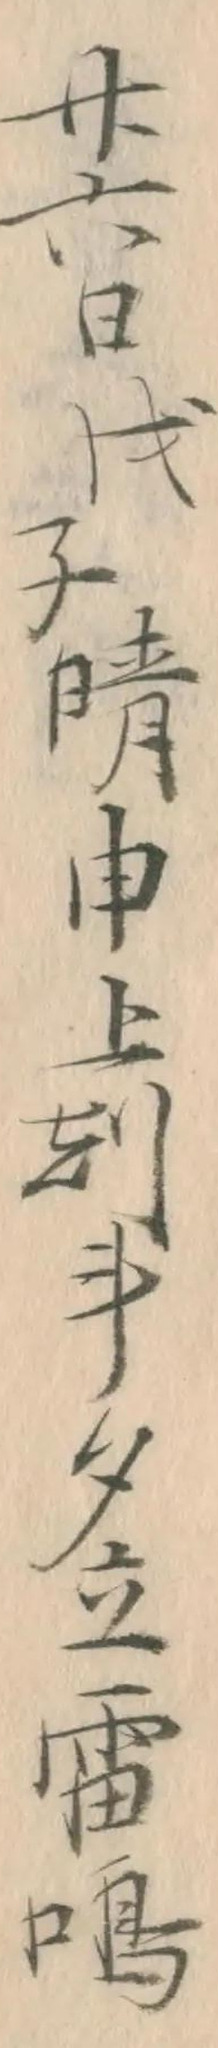廿六日戊子晴申上刻斗夕立雷鳴

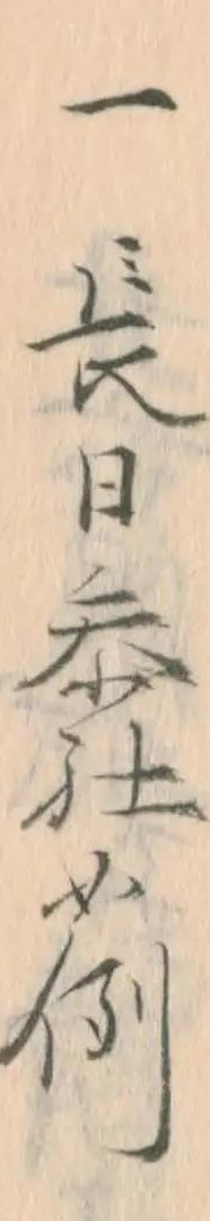一長日参社如例
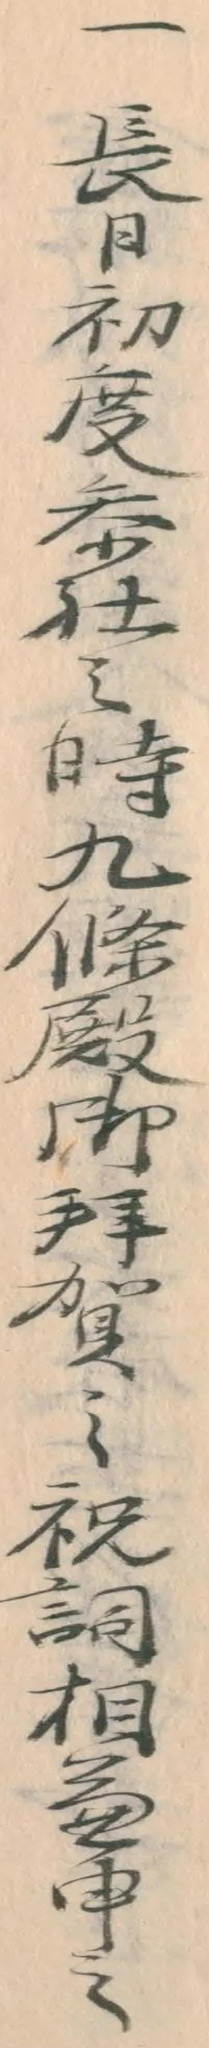一長日初度参社之時九條殿御拝賀之祝詞相兼申之
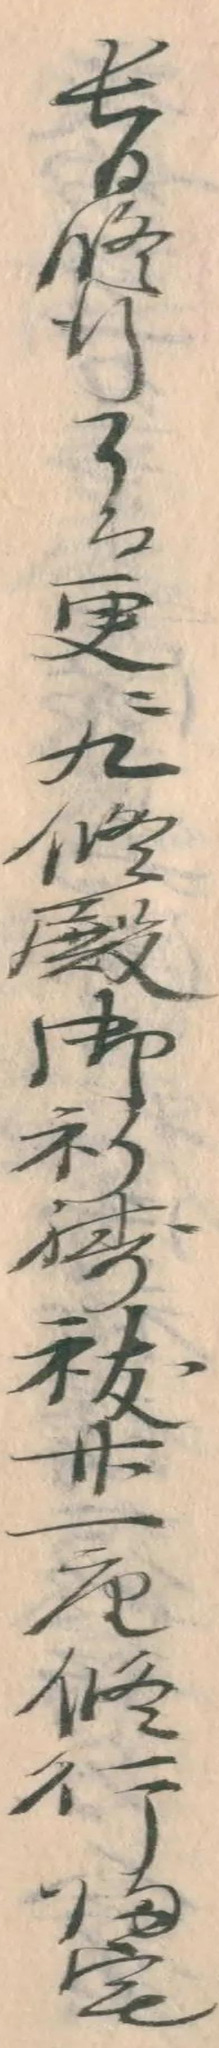長日修行了而更ニ九條殿御祈祷秡廿一座修行帰宅
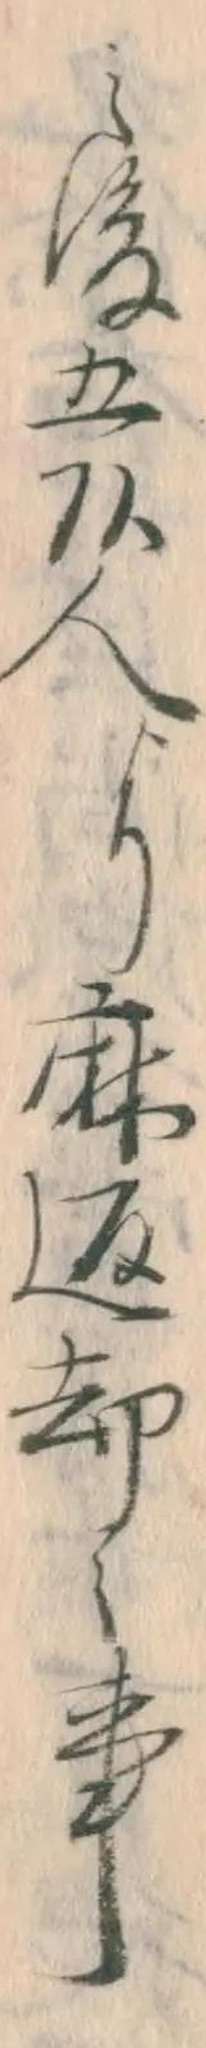之後五頭人より麻返却之事
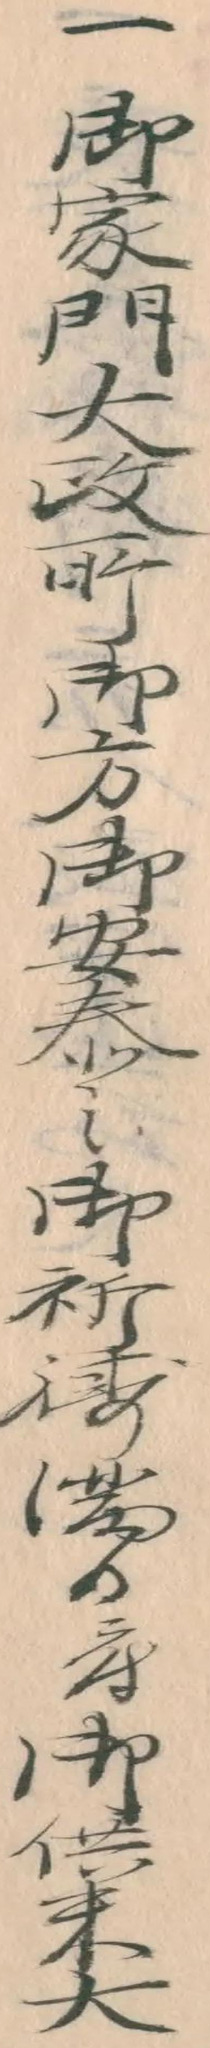一御家門大政所御方御安泰之御祈祷満日ニ付御供米大
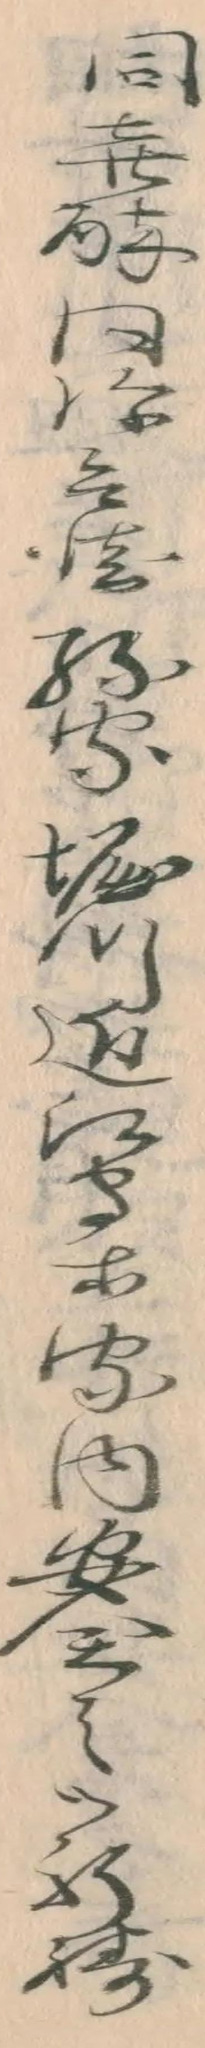同喜酔同弥兵衛孫家堀川近江守等家内安全之御祈祷
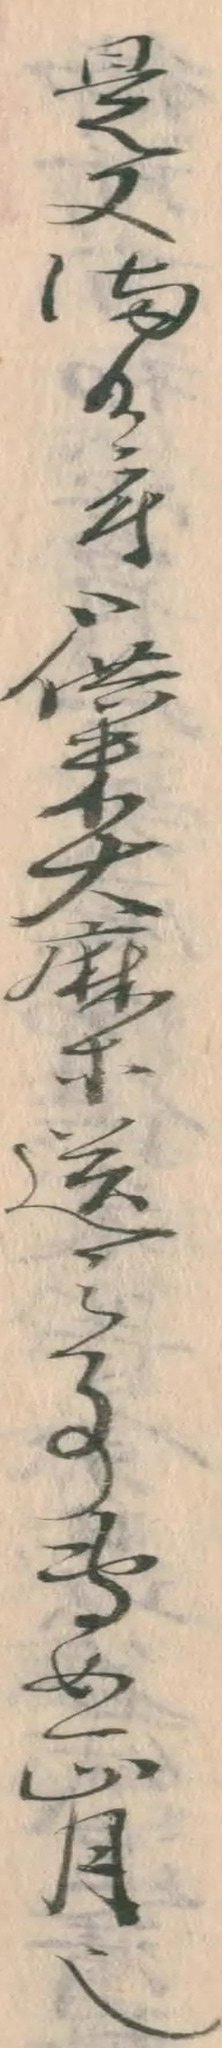是又満日ニ付御供米大麻等送之事處如正月也
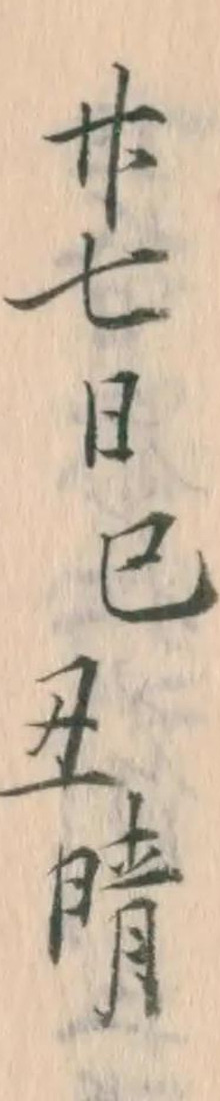廿七日己丑晴
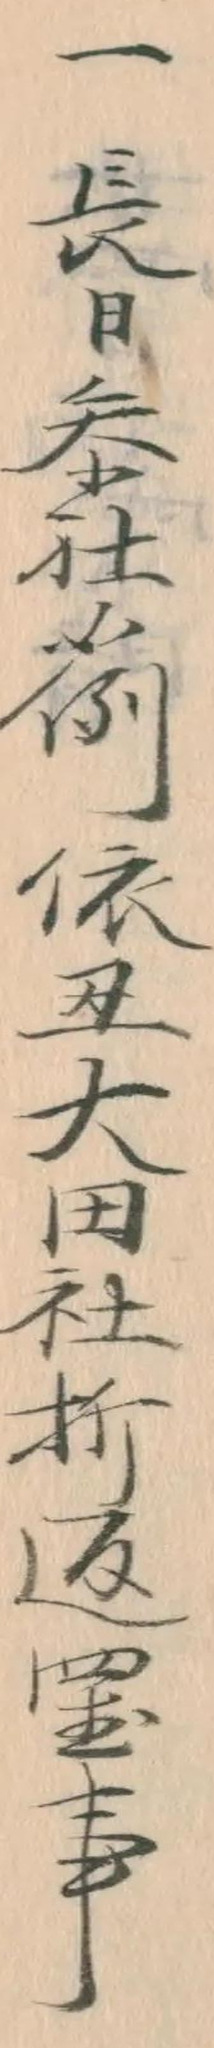一長日参社如例依丑大田社折返置事
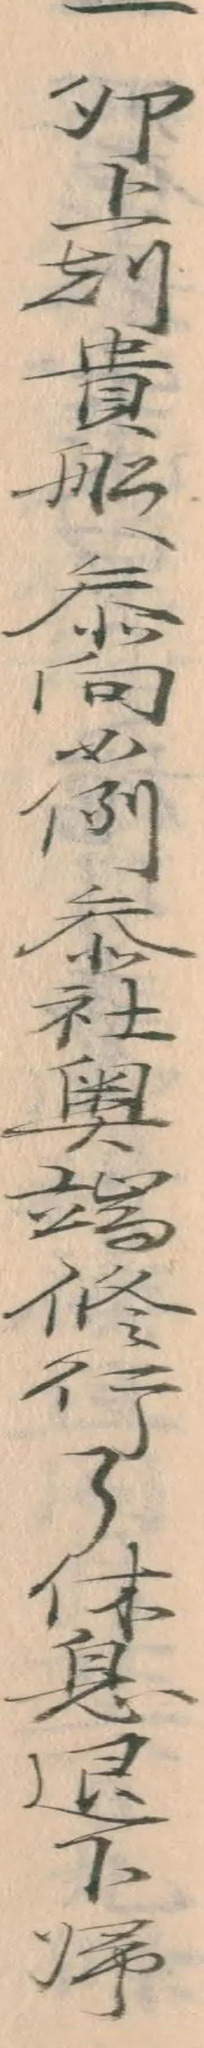一卯上刻貴舩へ参向如例参社奥端修行了休息退下帰
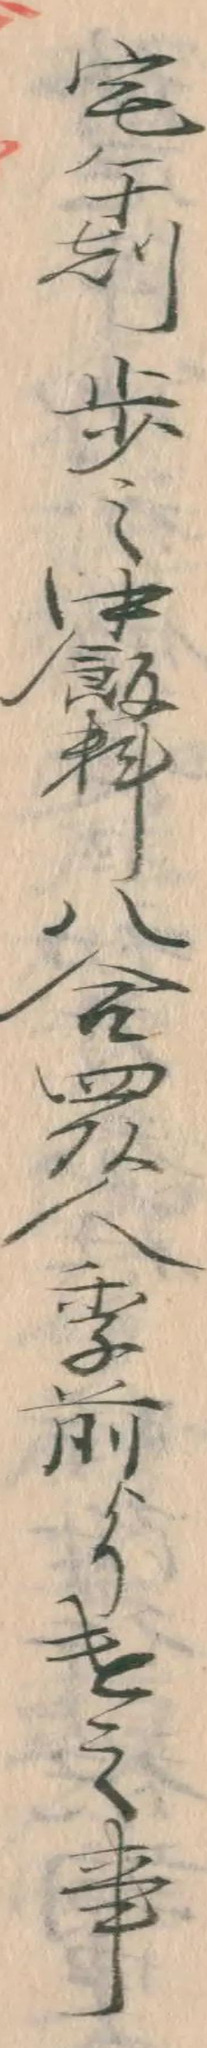宅午刻歩之中飯料八合四頭人季前より遣之事
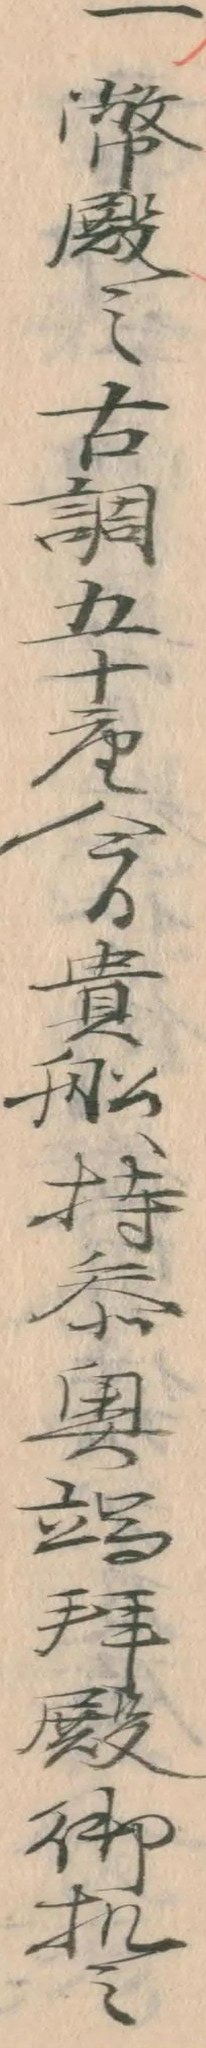一幣殿之古調五十座今日貴舩へ持参奥端拝殿御机之
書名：賀茂社記録. 第73冊
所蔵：国立国会図書館 National Diet Library, JAPAN
